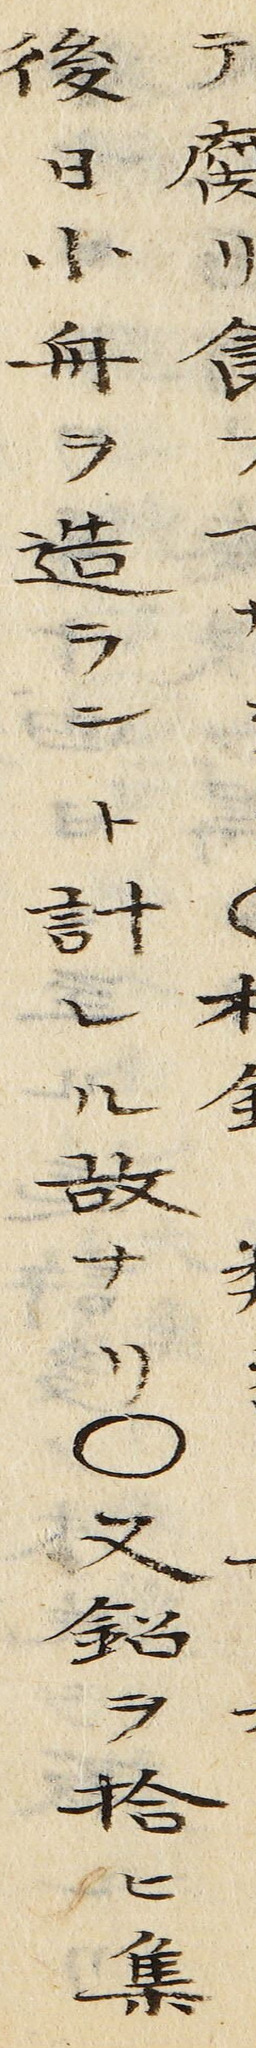後日小舟ヲ造ラント計レル故ナリ◯又鉛ヲ拾ヒ集
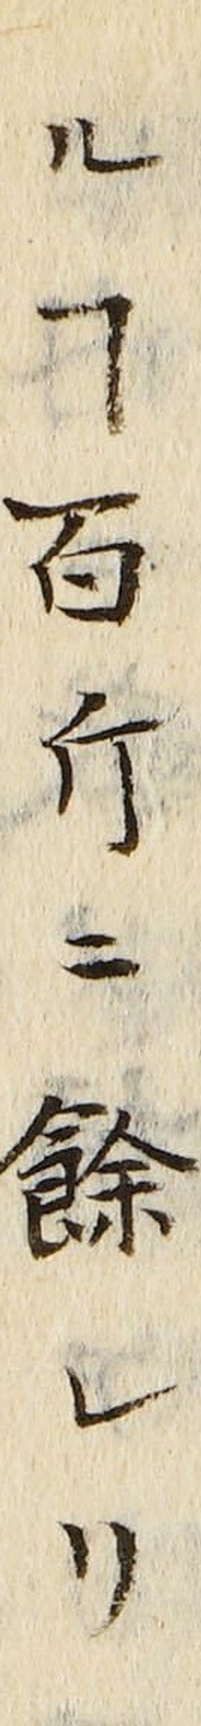ルコト百斤ニ余レリ
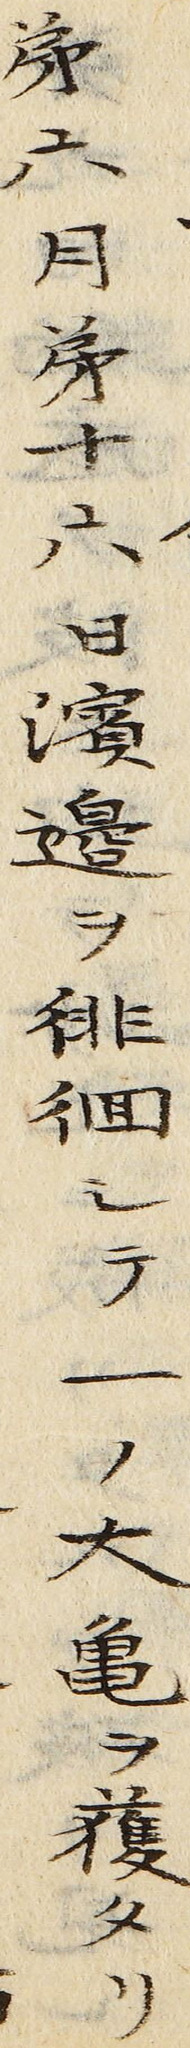第六月第十六日浜辺ヲ徘徊シテ一ノ大亀ヲ獲タリ
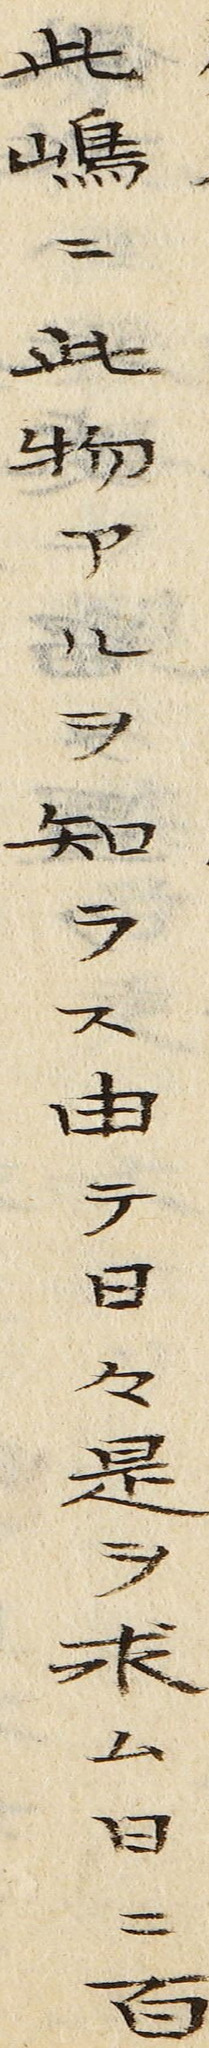此島ニ此物アルヲ知ラス由テ日々是ヲ求ム日ニ百
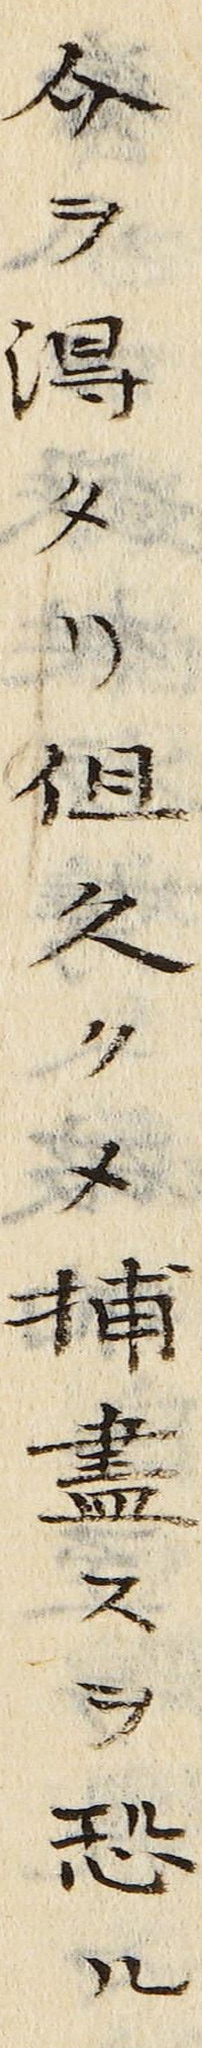介ヲ得タリ但久クシテ捕尽スヲ恐ル
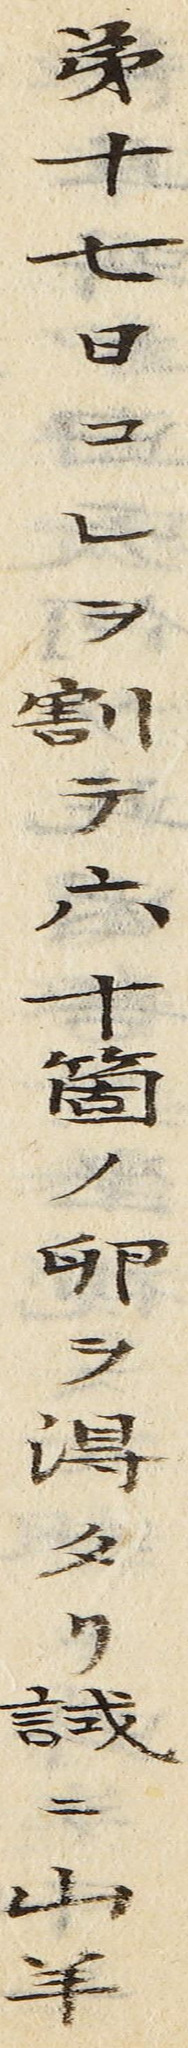第十七日コレヲ割テ六十箇ノ卵ヲ得タリ誠ニ山羊
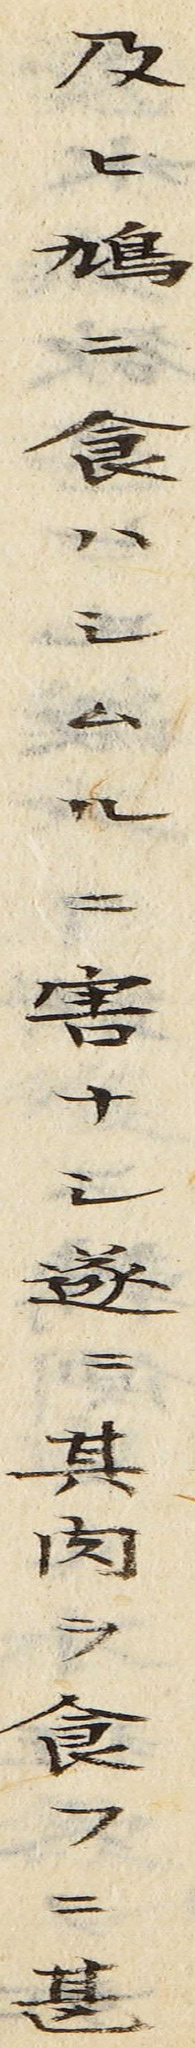及ヒ鳩ニ食ハシムルニ害ナシ遂ニ其肉ヲ食フニ甚
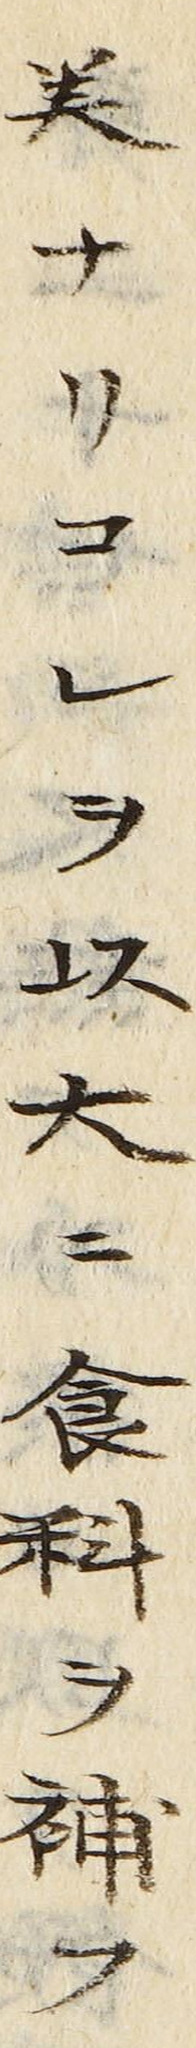美ナリコレヲ以大ニ食料ヲ補フ
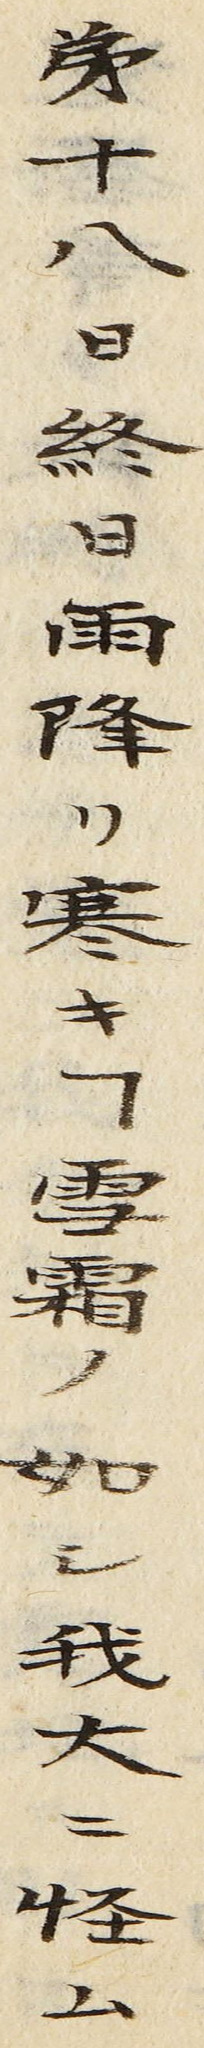第十八日終日雨降リ寒キコト雪霜ノ如シ我大ニ怪ム
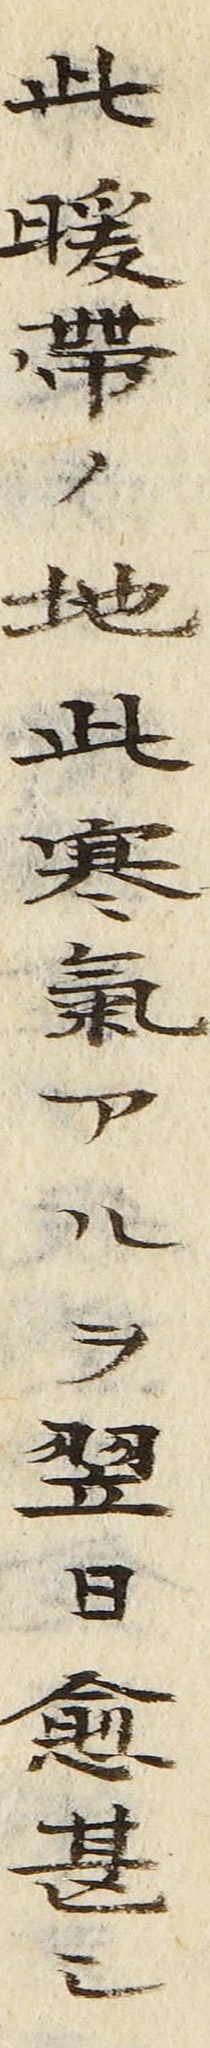此暖帯ノ地此寒気アルヲ翌日愈甚シ
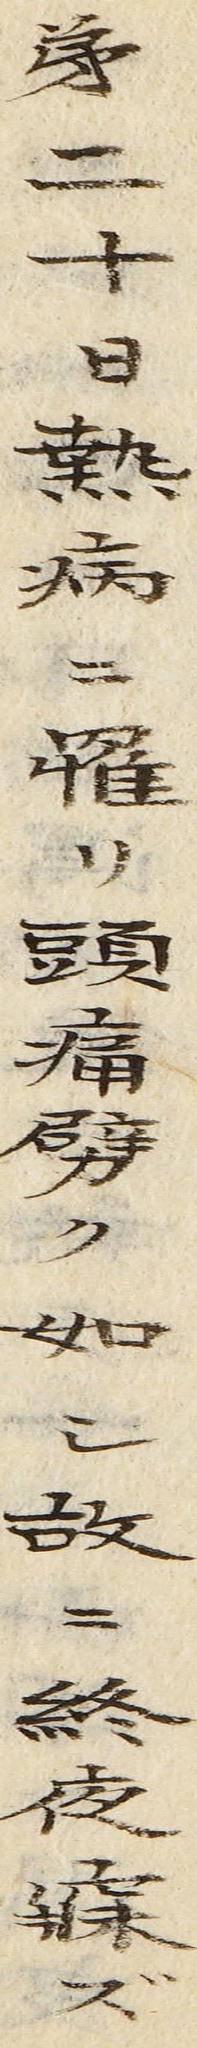第二十日熱病ニ罹リ頭痛劈ク如シ故ニ終夜寐ズ
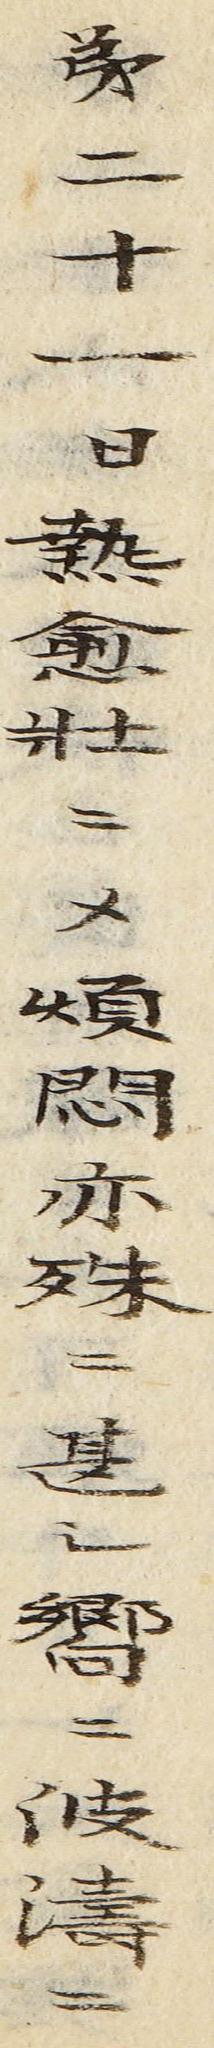第二十一日熱愈壮ニシテ煩悶亦殊ニ甚シ嚮ニ波濤ニ
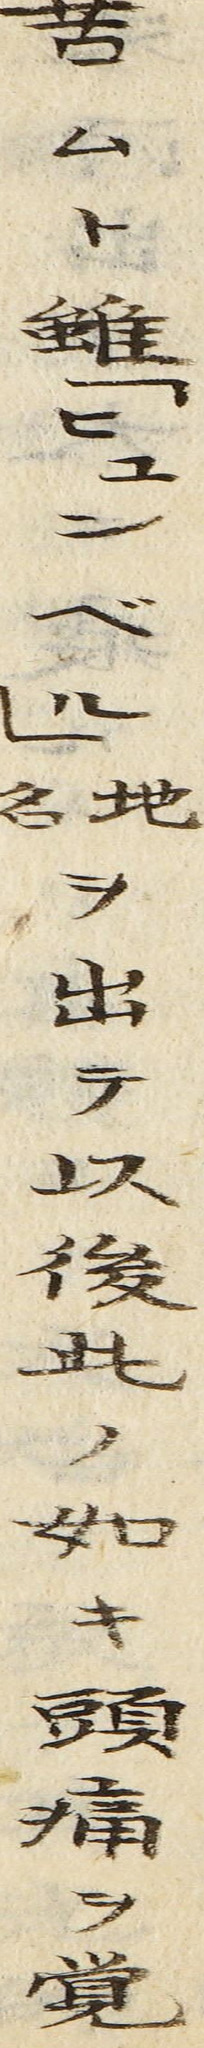苦ムト雖「ヒユンベル」地名ヲ出テ以後此ノ如キ頭痛ヲ覚
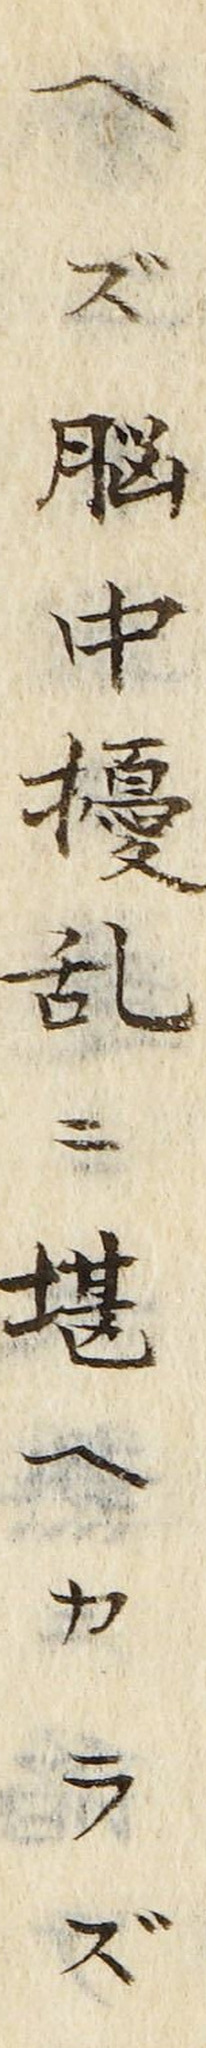ヘズ脳中擾乱ニ堪ヘカラズ
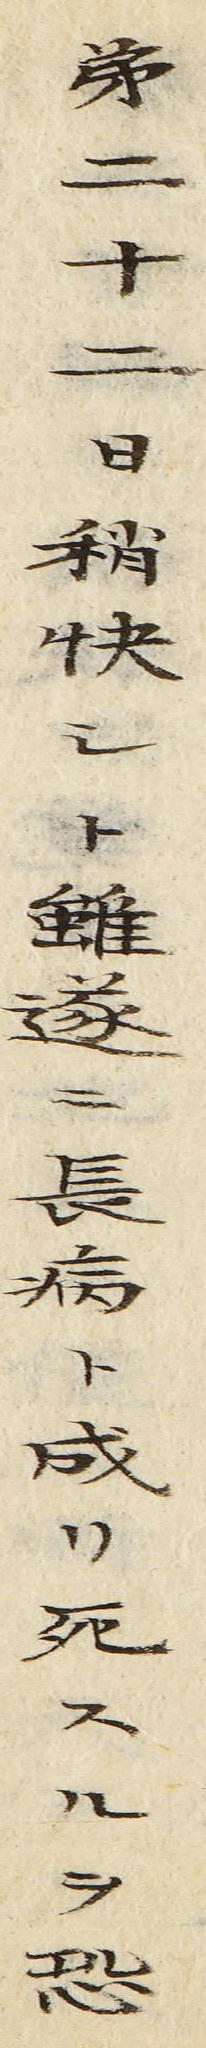第二十二日稍快シト雖遂ニ長病ト成リ死スルヲ恐

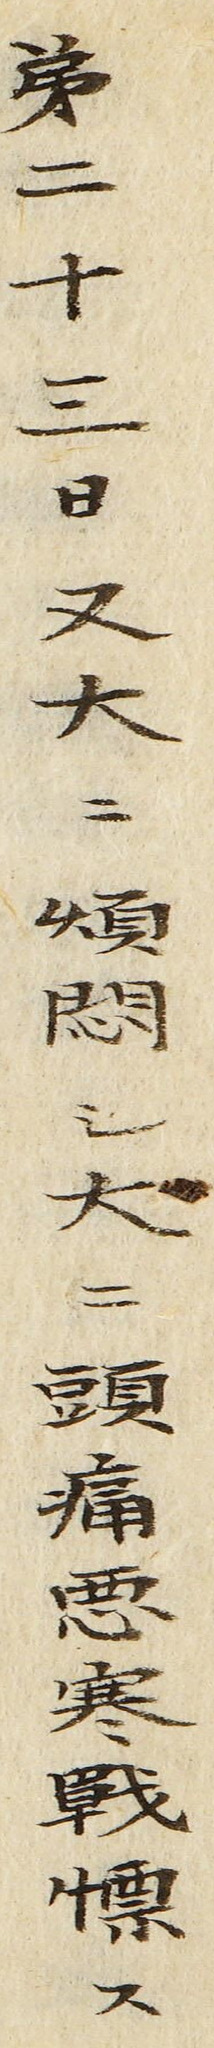第二十三日又大ニ煩悶シ大ニ頭痛悪寒戦慄ス
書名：漂流紀事
